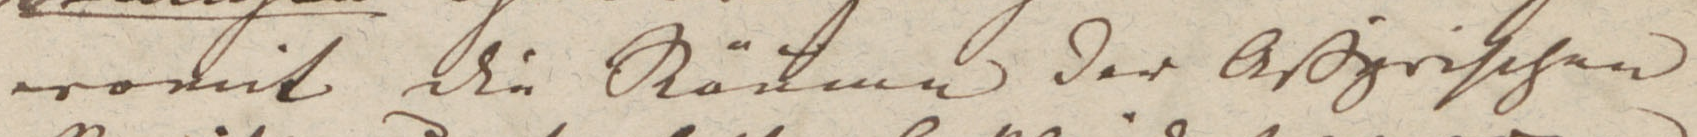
womit die Räume der Assyrischen
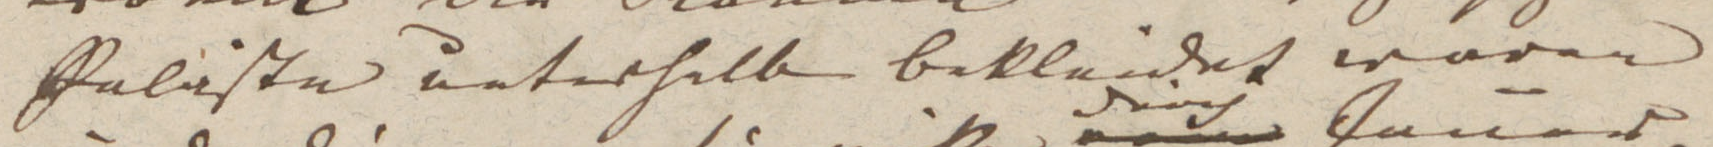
Paläste unterhalb bekleidet waren
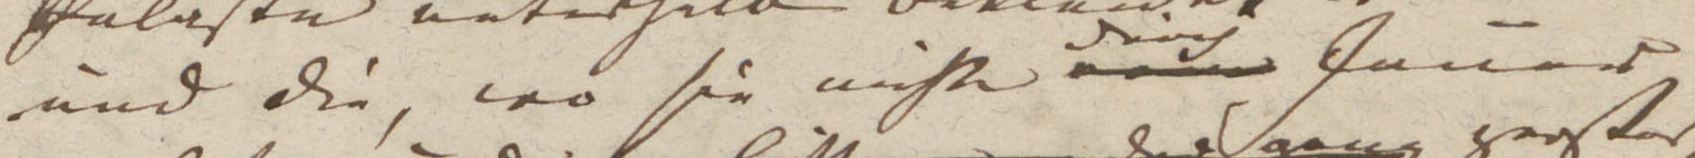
und die, wo sie nicht vom durch Feuer
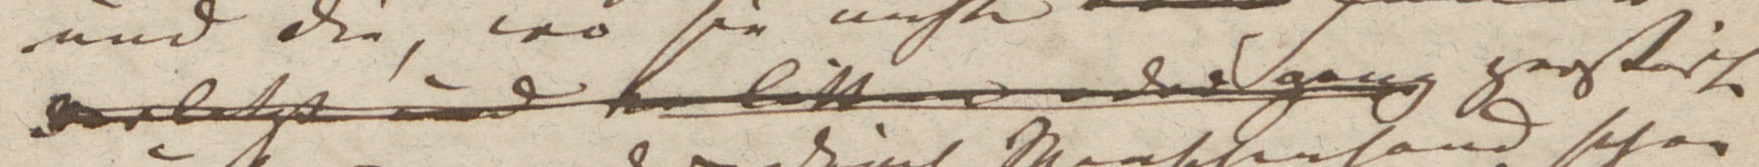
verletzt und litten oder ganz zerstört
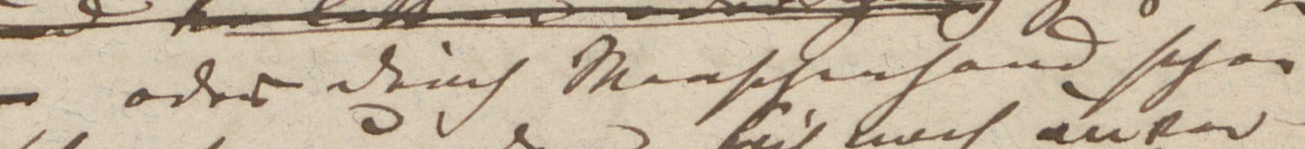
oder durch Menschenhand schon
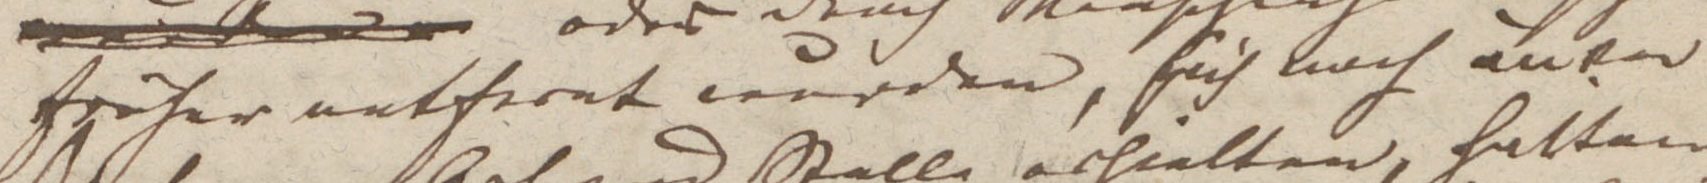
früher entfernt wurden, sich noch unver-
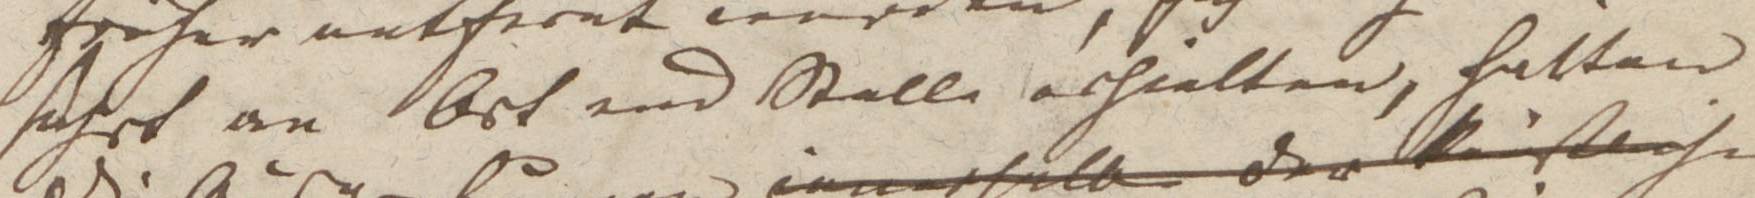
sehrt an Ort und Stelle erhielten, hätten
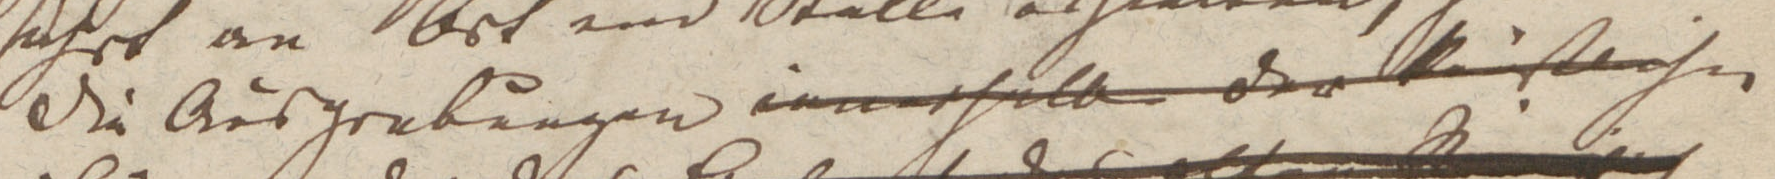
die Ausgrabungen innerhalb der künstlichen
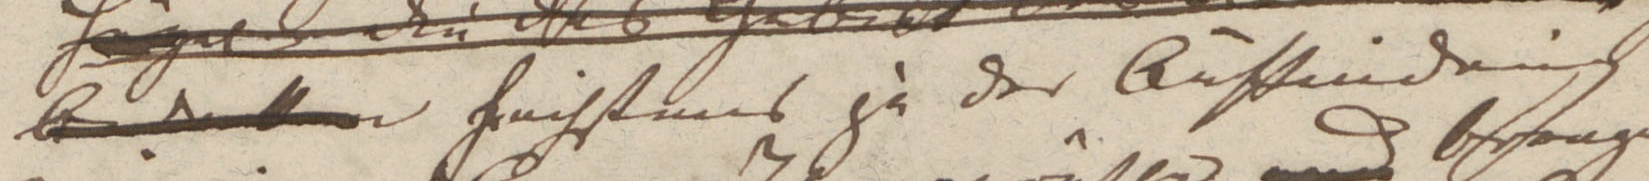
bedecken höchstens zu der Auffindung
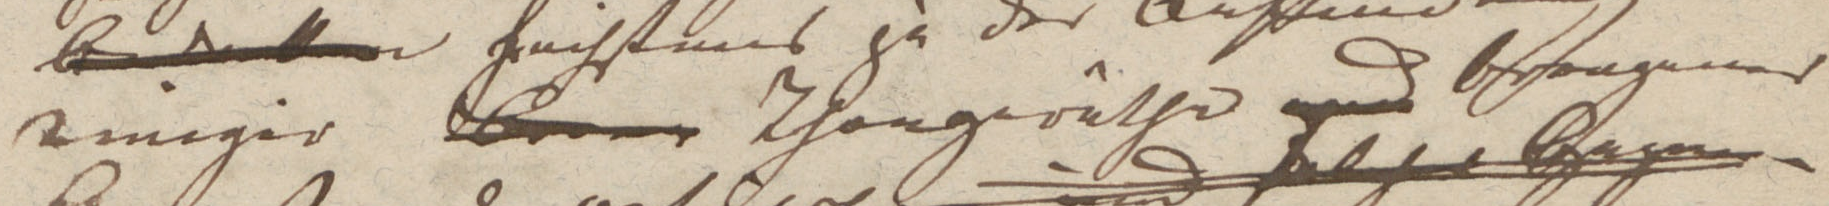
einiger Bron Thongeräthe und bronzener
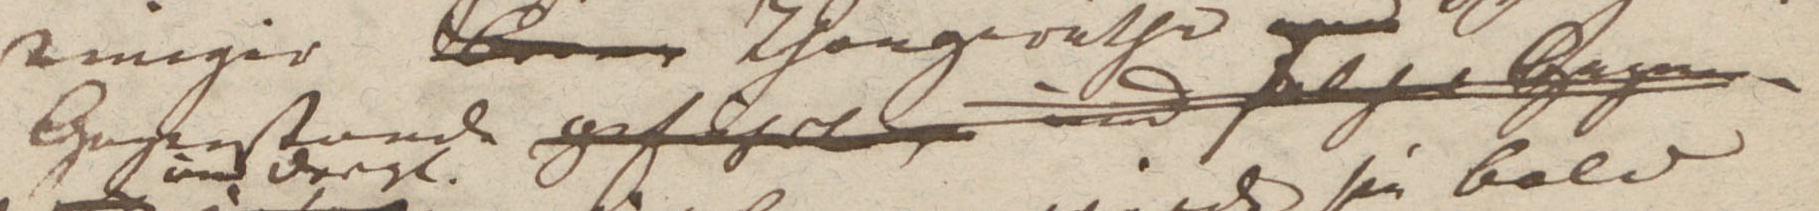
Gegenstande geführt, und solcher Gegen-
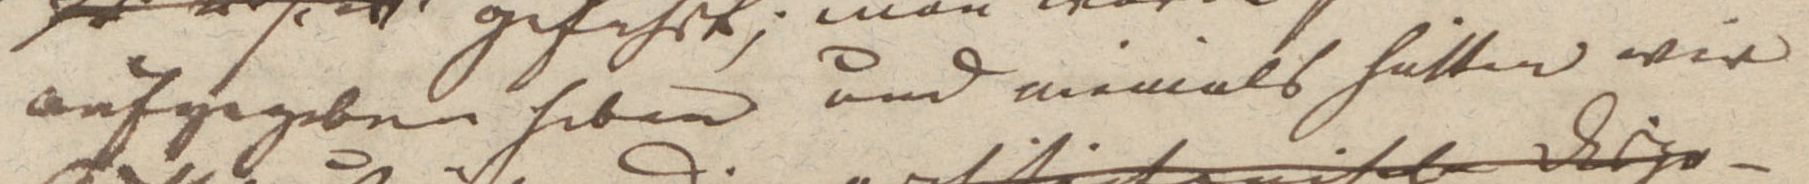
aufgegeben haben und niemals hätten wir
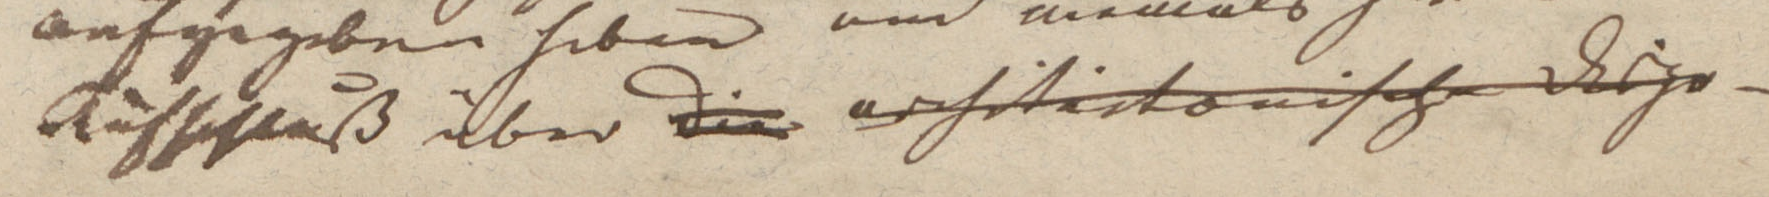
Aufschluss über die architectonische Dispo-
